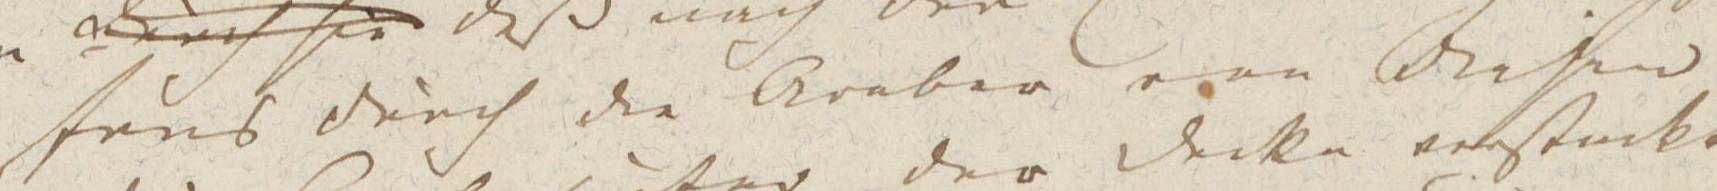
tens durch die Araber von diesen
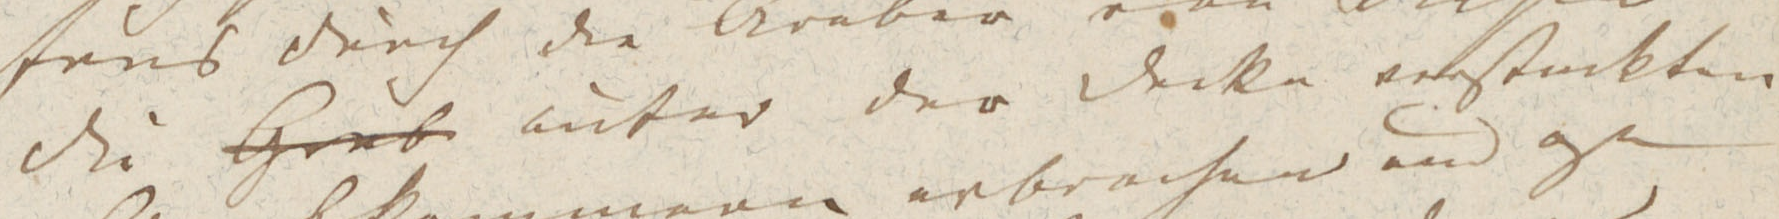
die Grab unter der Decke versteckten
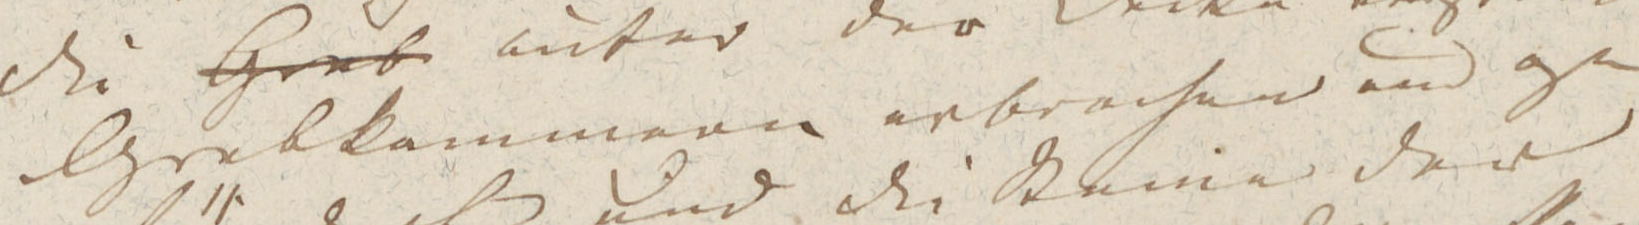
Grabkammern erbrochen und ge-
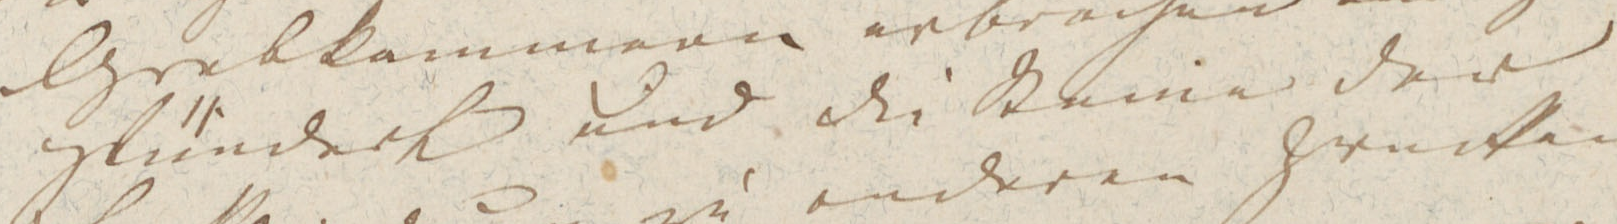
plündert und die Steine der
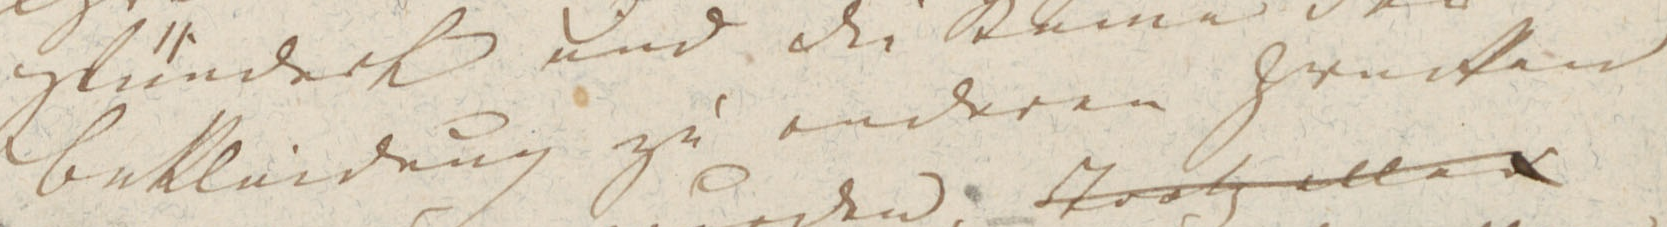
Bekleidung zu anderen Zwecken
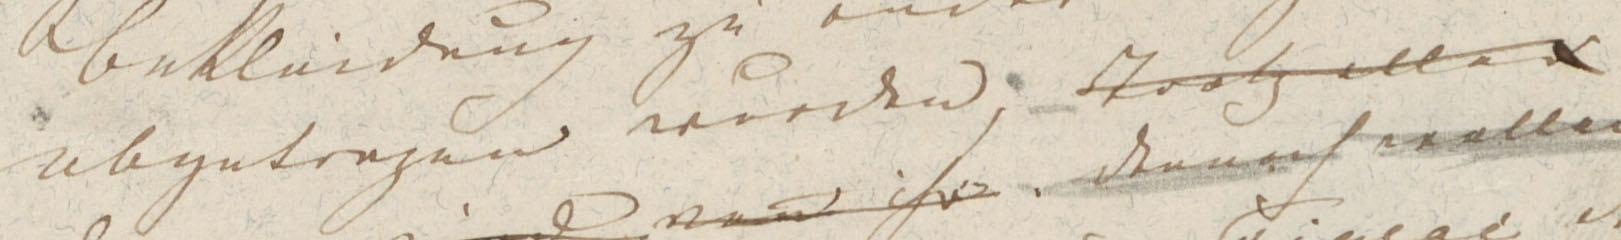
abgetragen wurden,. - trotz aller
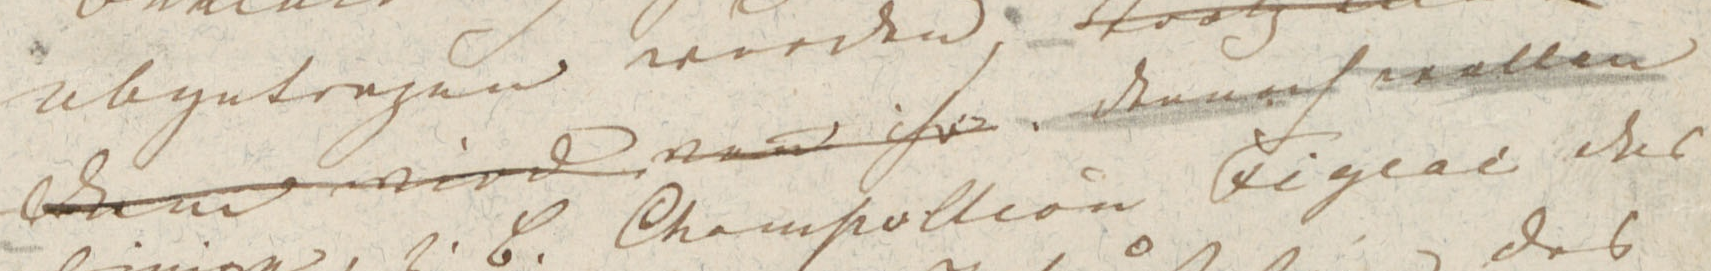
Dem wird man ihre Dennoch wollen
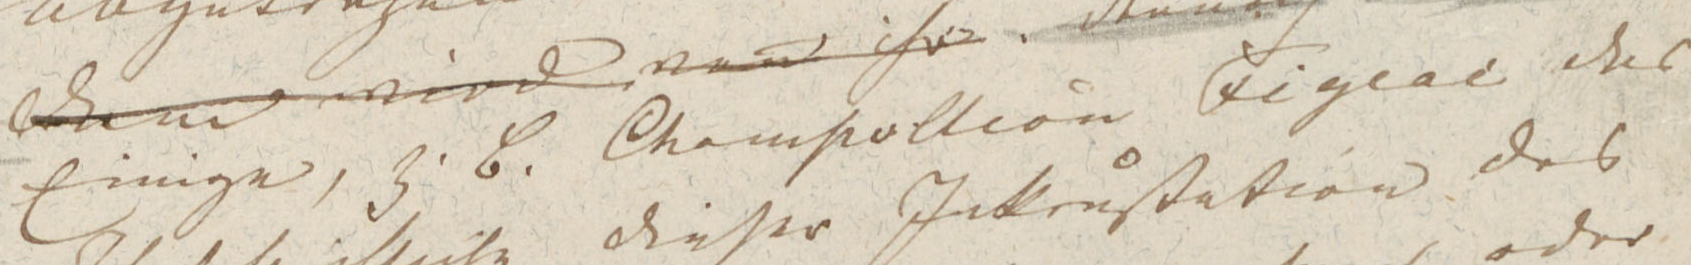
Einige, z. B. Champollion Figeac das
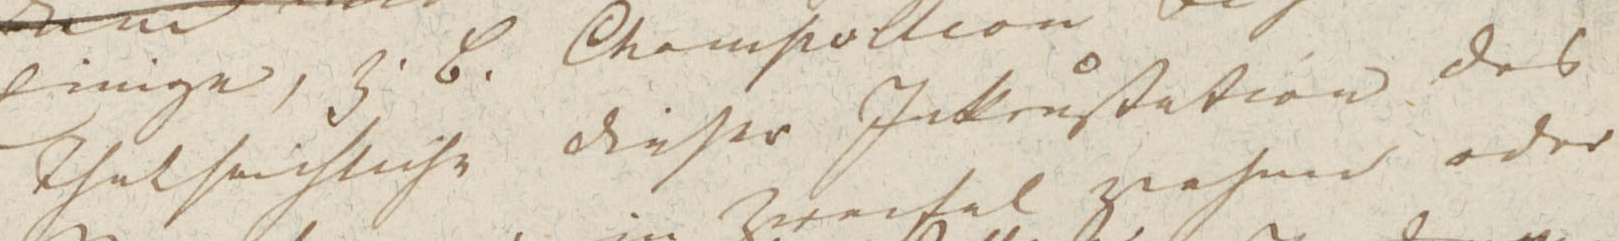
Thatsächliche dieser Inkrustation des
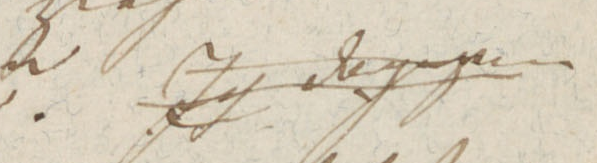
entschieden verneinen
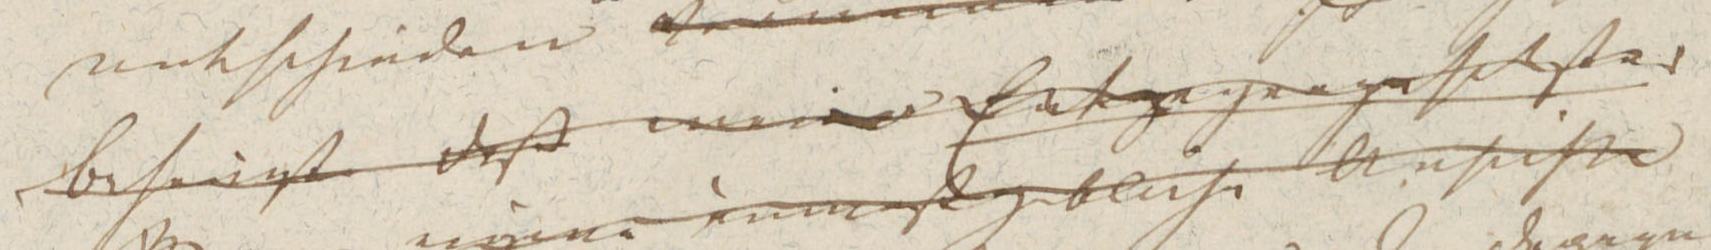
behaupte dass meiner Entgegengesetzter
